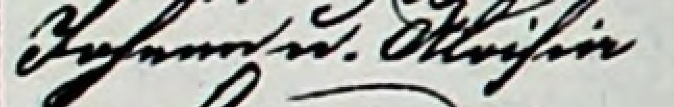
Johann u. Aloisia
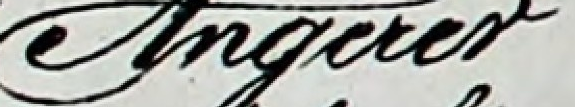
Angerer
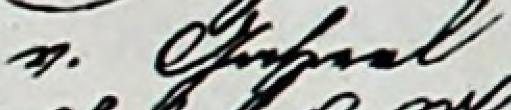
v. Gasperl
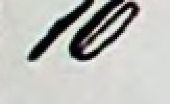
16
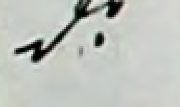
do
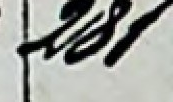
281
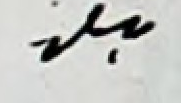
do
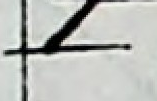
I
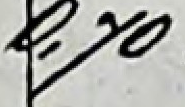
0,70
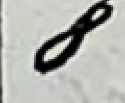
8
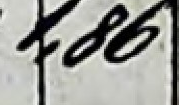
1,86
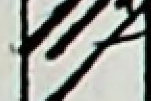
117
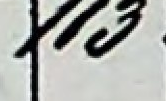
113
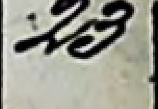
23
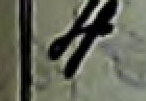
4
